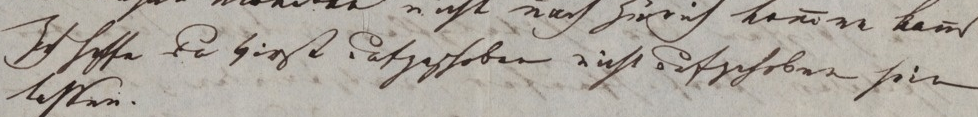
Ich hoffe Du wirst aufgeschoben nicht aufgehoben sein
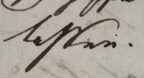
lassen.
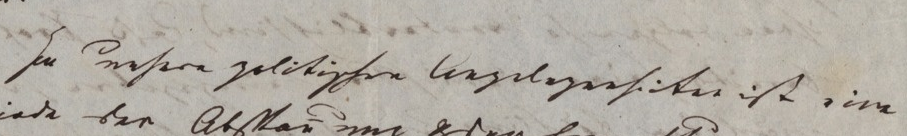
In unsere politischen Angelegenheiten ist eine
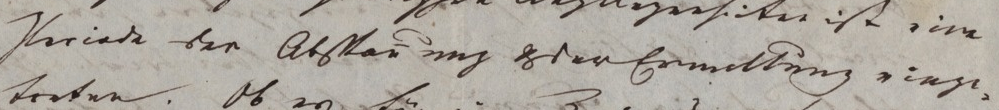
Periode der Abspannung & der Ermattung einge-
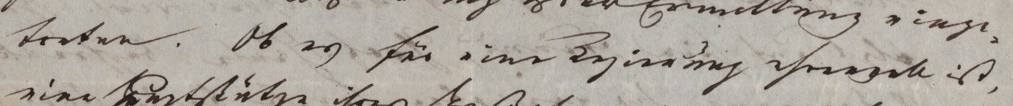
treten. Ob es für eine Regierung ehrenvoll ist,
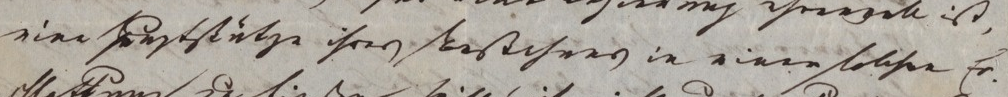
eine Hauptstütze ihres Bestehens in einer solchen Er-
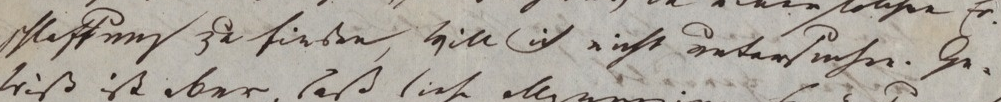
schlaffung zu finden, will ich nicht untersuchen. Ge-
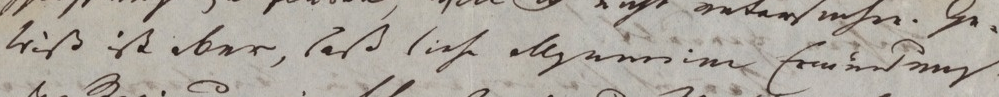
wiß ist aber, daß diese allgemeine Ermüdung
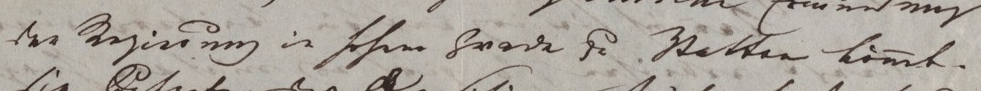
der Regierung in hohem Grade zu Statten kömmt.
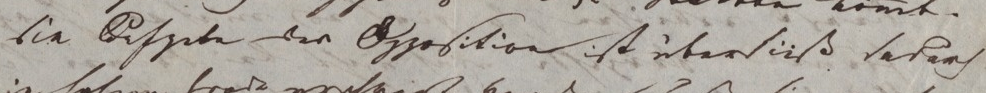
Die Aufgabe der Opposition ist überdieß dadurch
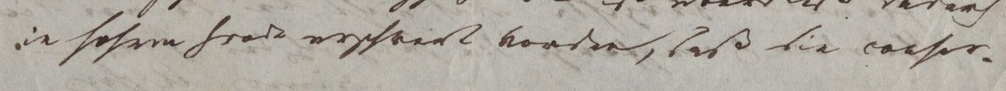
in hohem Grade erschwert worden, daß die conser-
